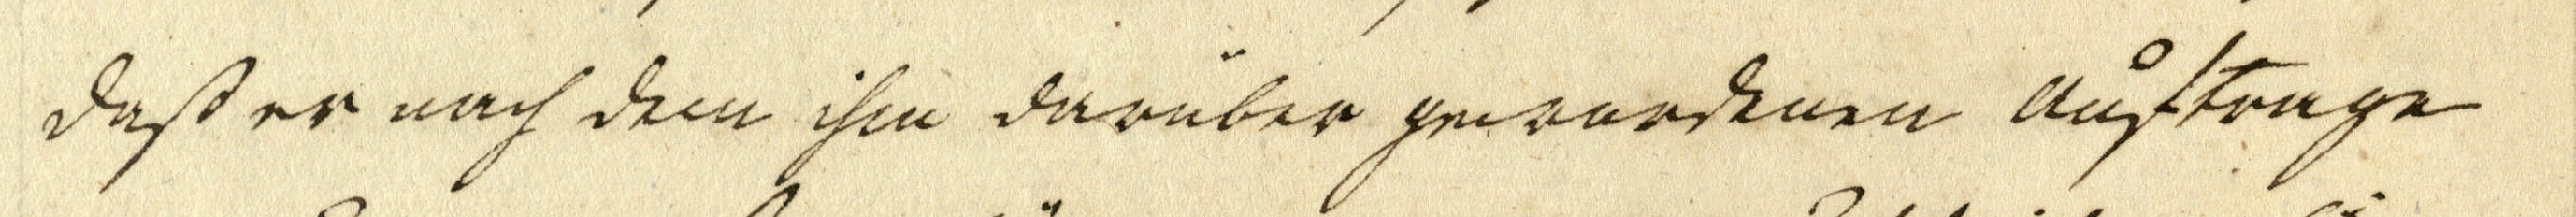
daß er nach dem ihm darüber gewordenen Auftrage
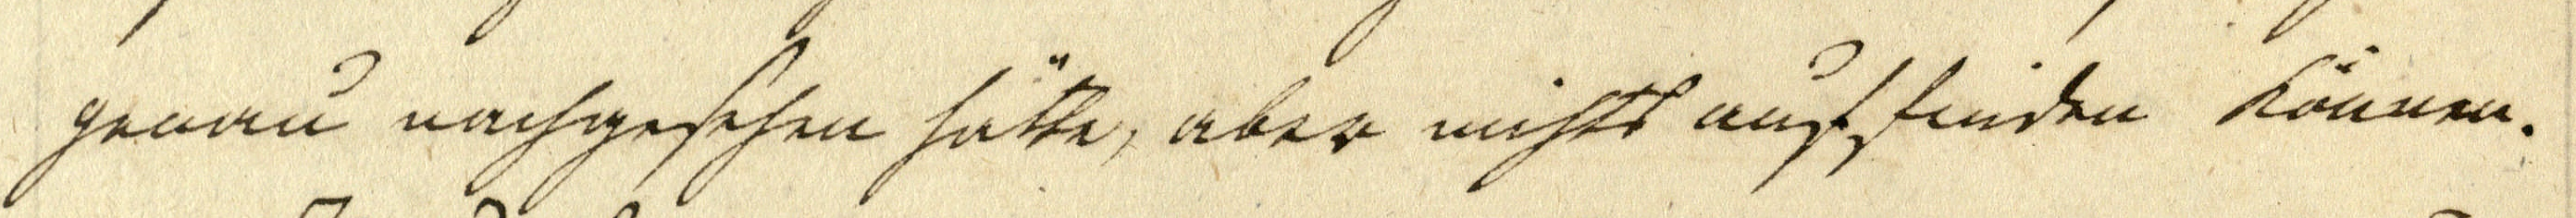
genau nachgesehen hätte, aber nichts auffinden können.
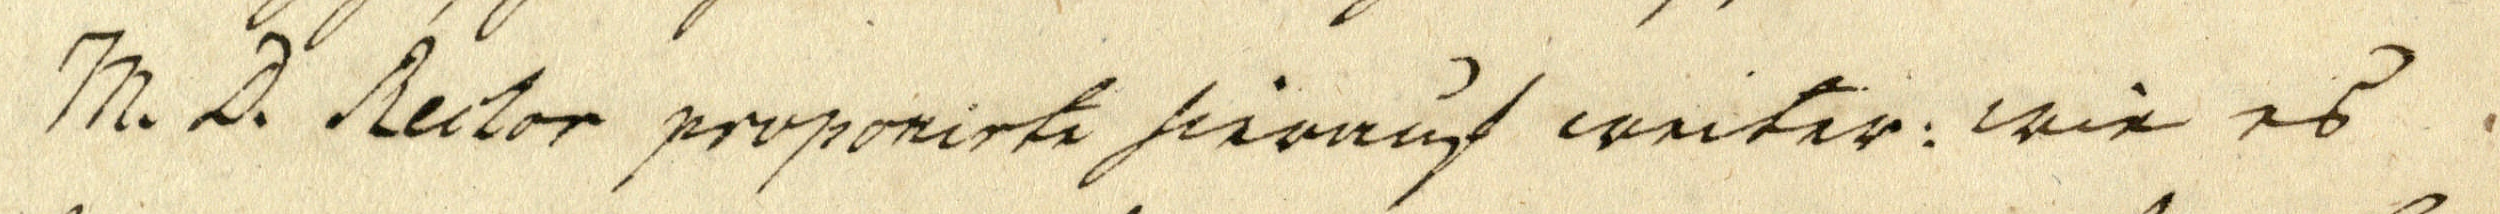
M. D. Rector proponirte hierauf weiter: wie es
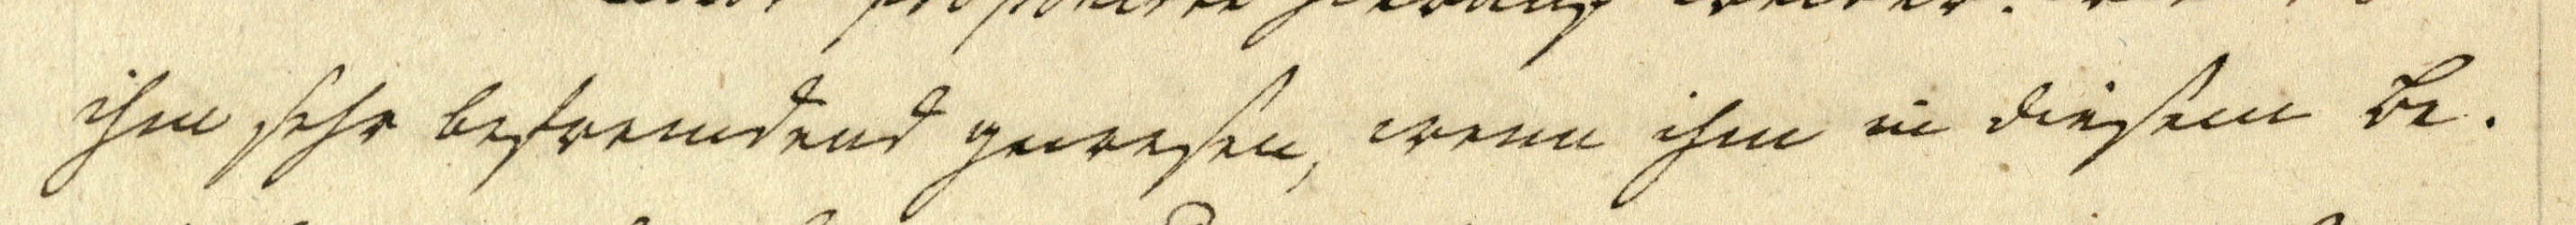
ihm sehr befremdend gewesen, wenn ihm in diesem Be¬
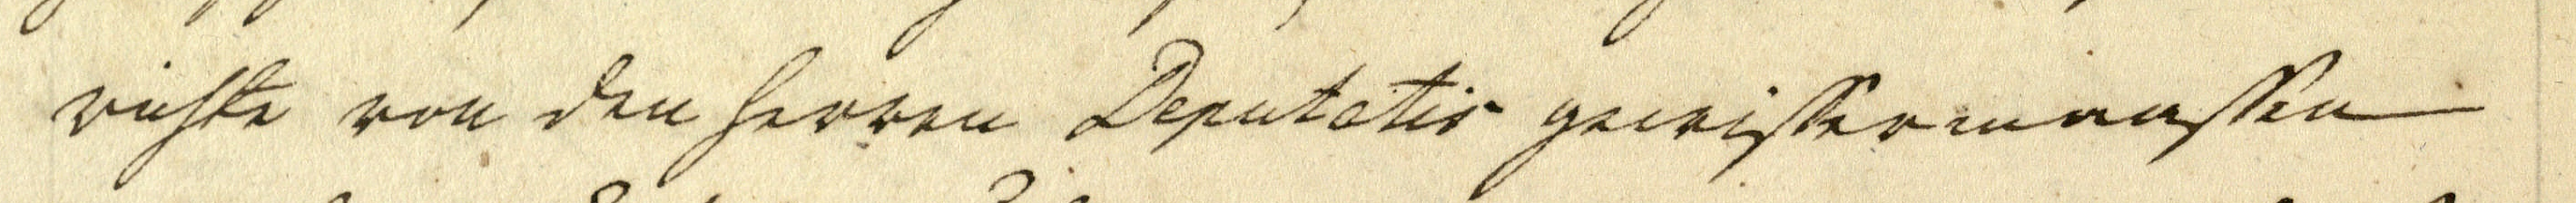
richte von den herren Deputatis gewissermaassen
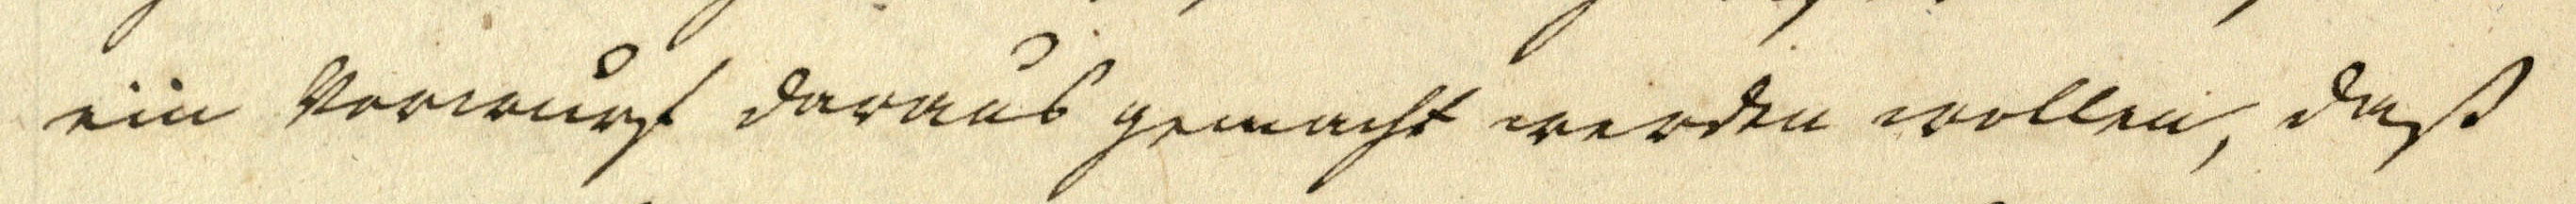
ein Vorwurf daraus gemacht werden wollen, daß
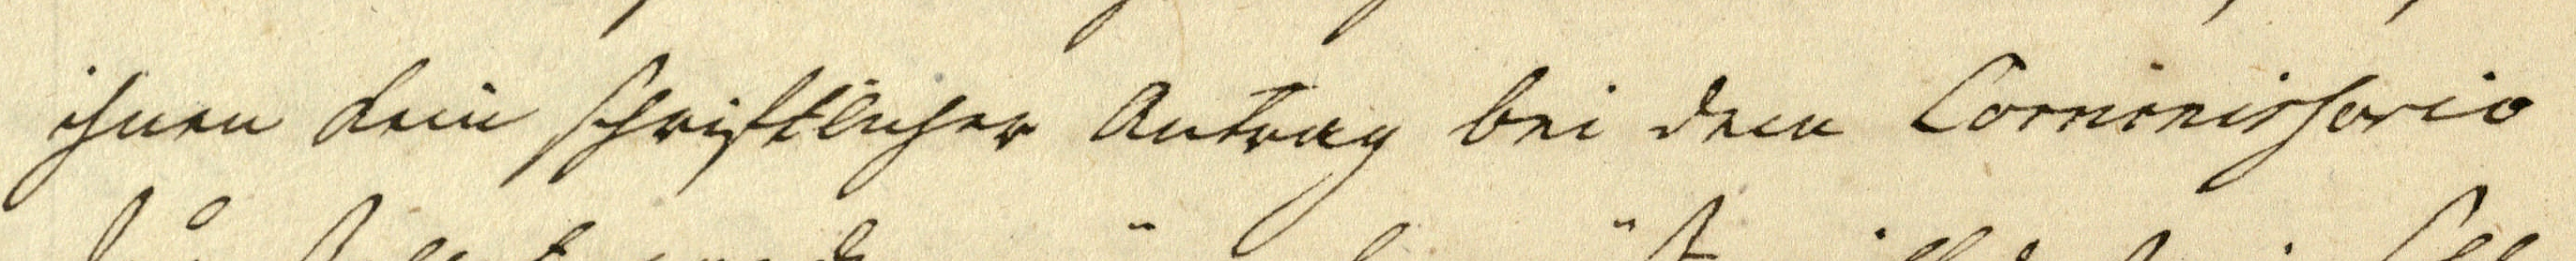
ihnen kein schriftlicher Antrag bei dem Commissario
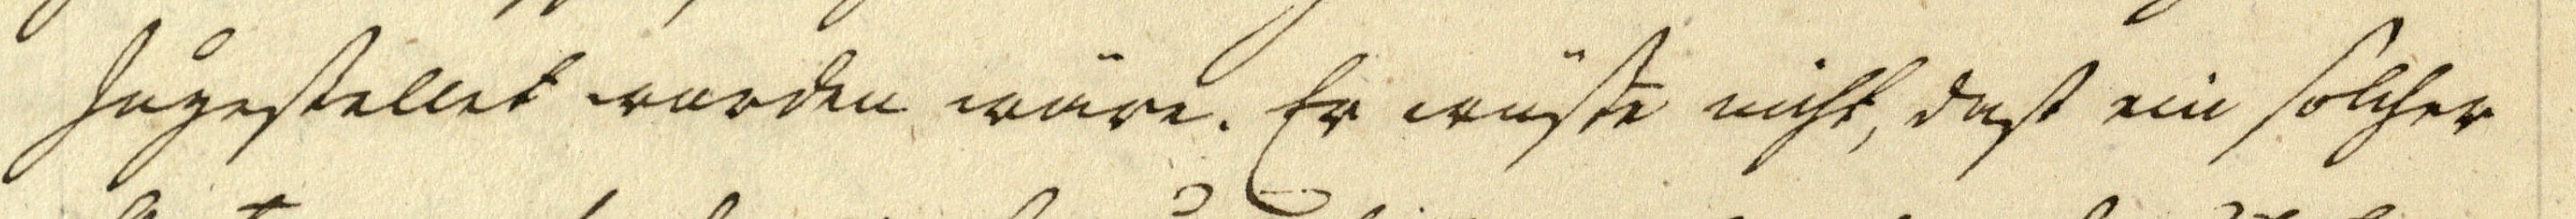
zugestellet worden wäre. Er wüste nicht, daß ein solcher
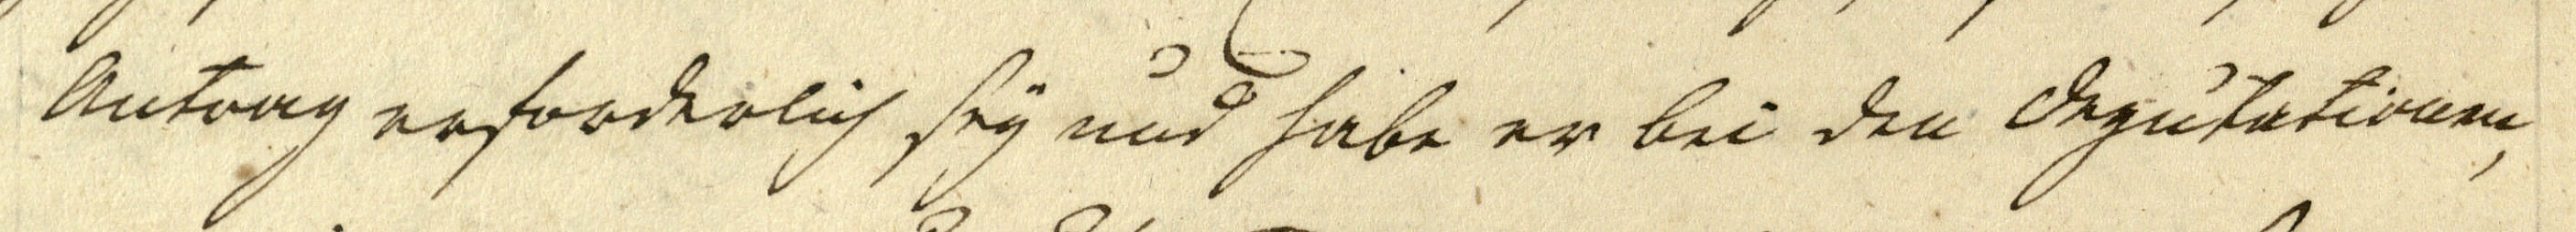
Antrag erforderlich seÿ und habe er bei den Deputationen,
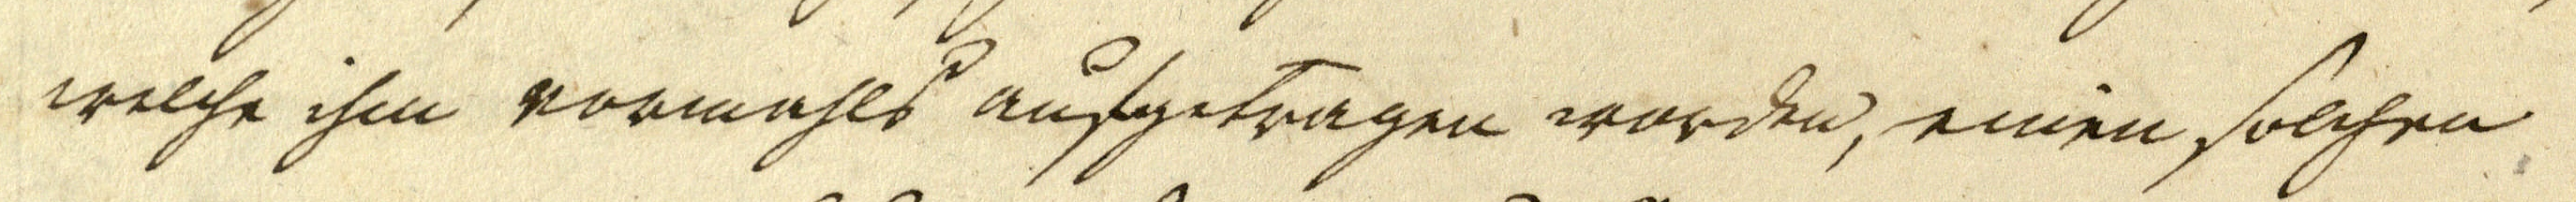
welche ihm vormahls aufgetragen worden, einen solchen
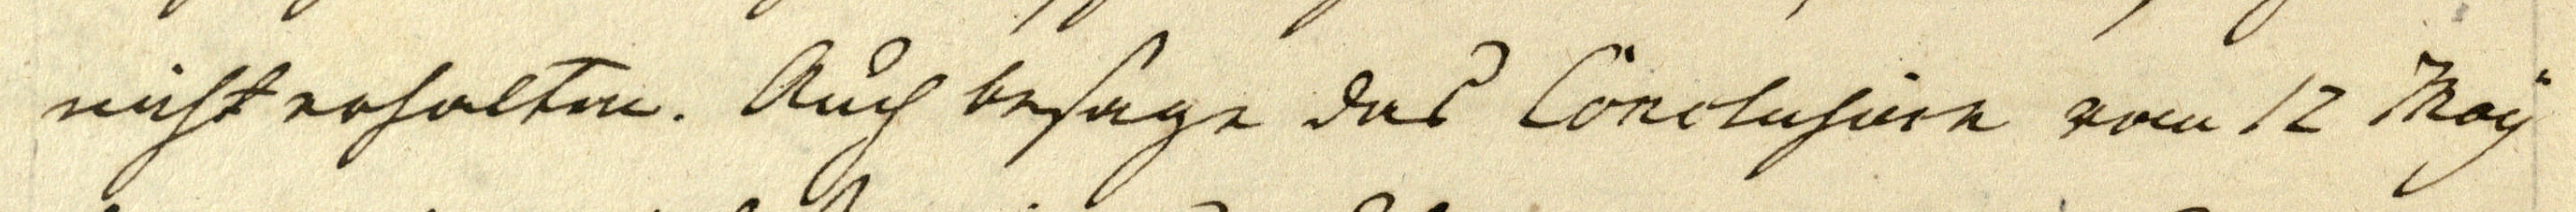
nicht erhalten.Auch besage das Conclusum vom 12. Maÿ
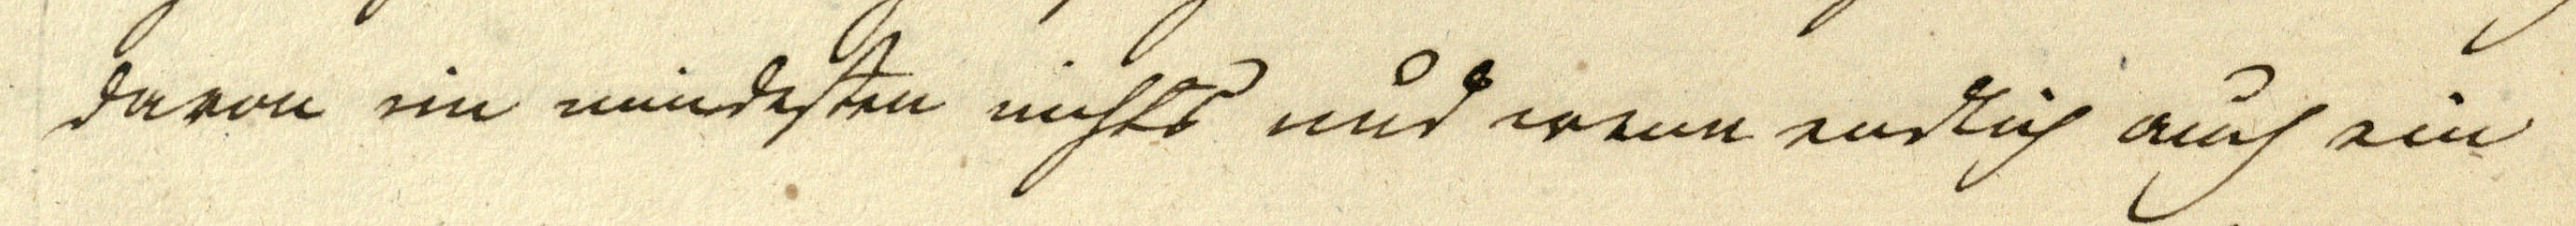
davon im mindesten nichts und wenn endlich auch ein
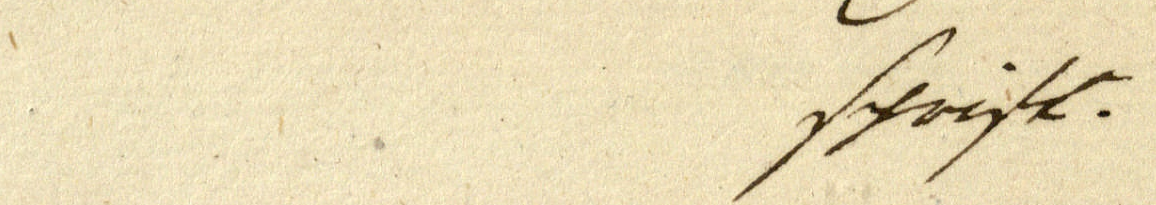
schrift.
